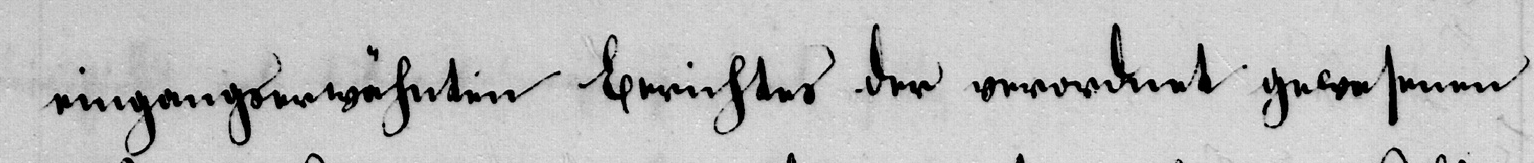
eingangserwähnten Berichtes der verordnet gewesenen
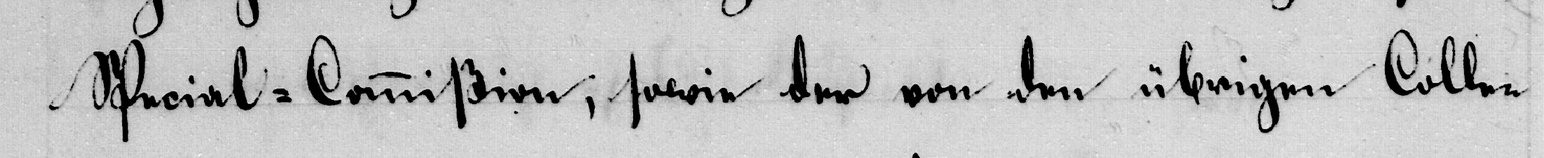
Special-Commißion, sowie der von den übrigen Colle¬
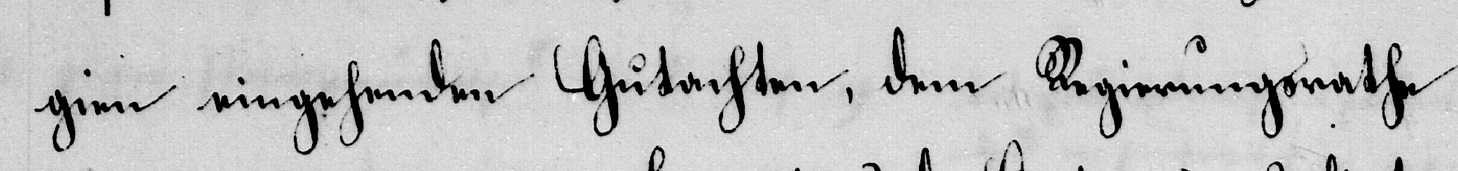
gien eingehenden Gutachten, dem Regierungsrathe
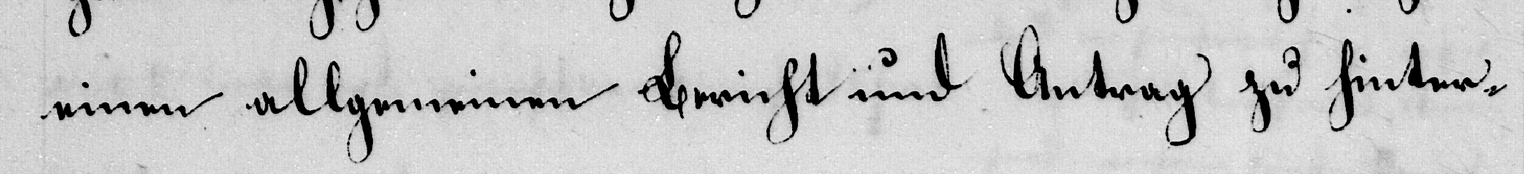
einen allgemeinen Bericht und Antrag zu hinter¬
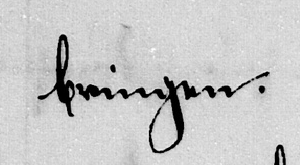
bringen.
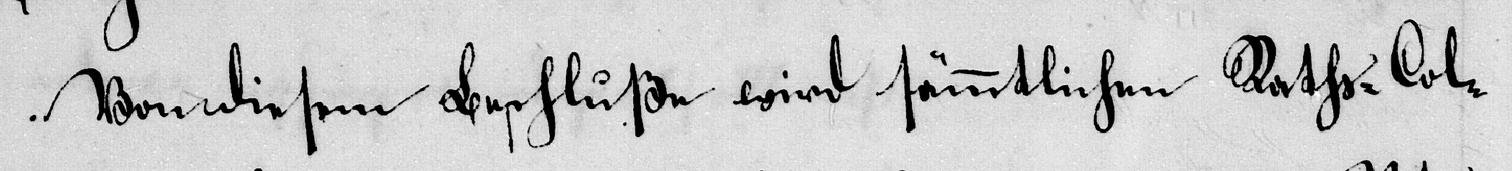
Von diesem Beschluße wird sämmtlichen Raths-Col¬
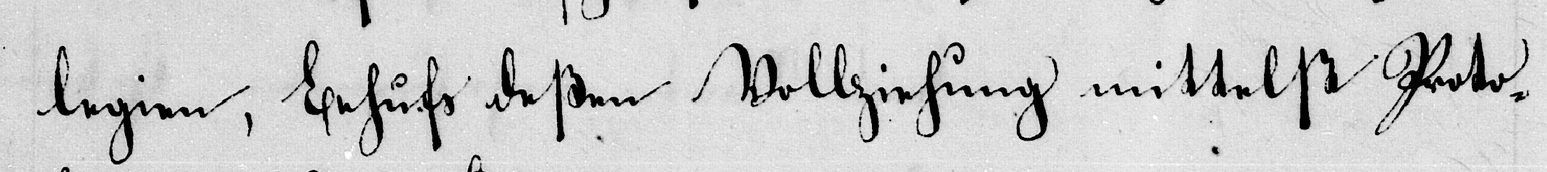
legien, Behufs dessen Vollziehung mittelst Proto¬
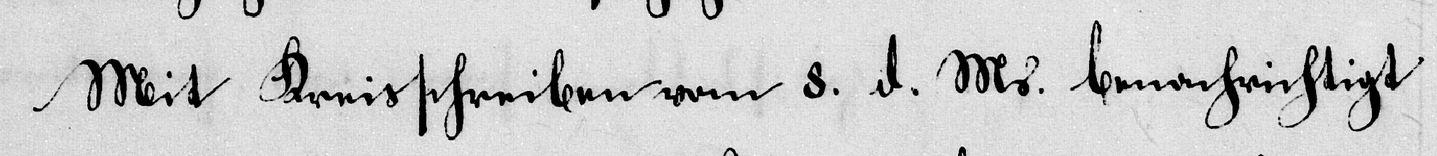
Mit Kreisschreiben vom 8. d. Ms. benachrichtigt
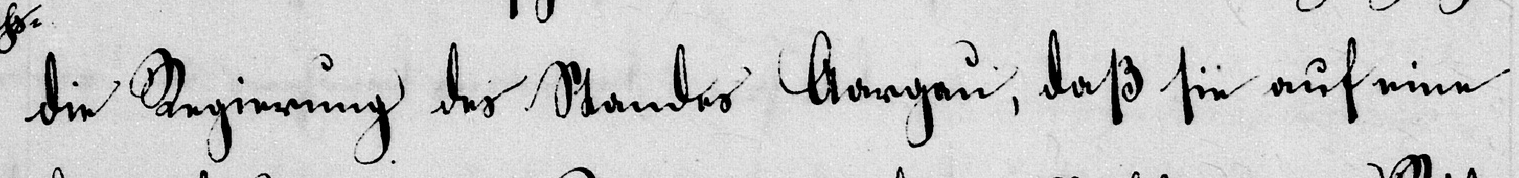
die Regierung des Standes Aargau, daß sie auf eine
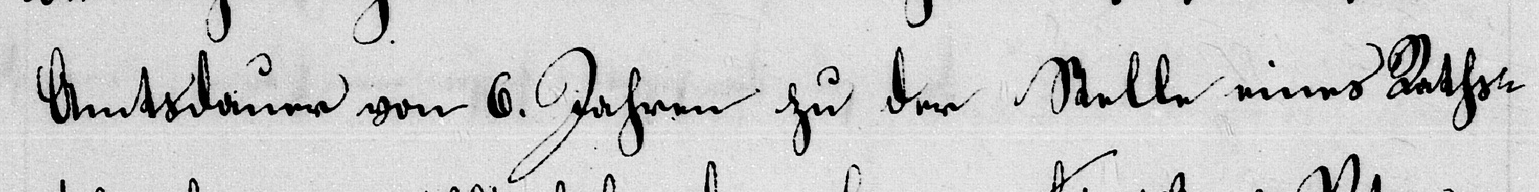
Amtsdauer von 6. Jahren zu der Stelle eines Raths¬
